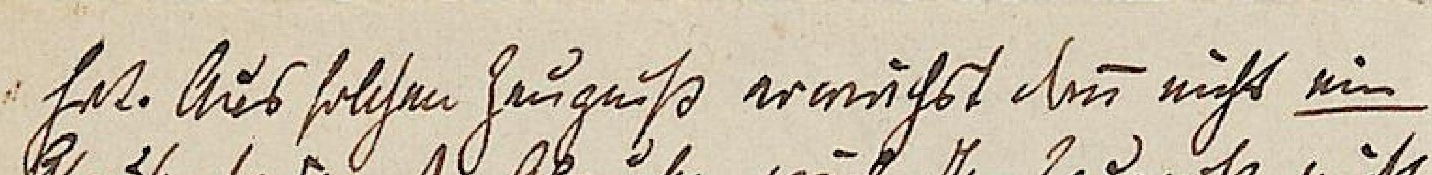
hat. Aus solchen Zeugniß erwächst dan nicht ein
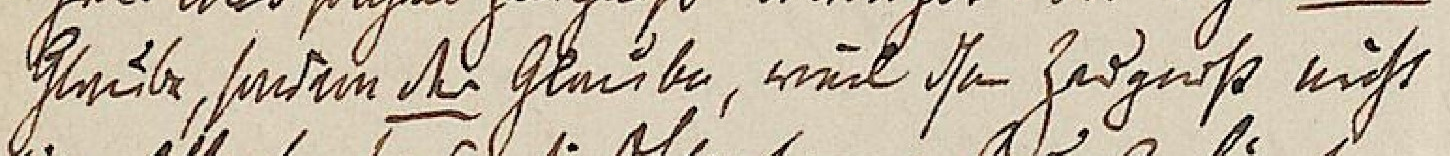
Glaube, sondern der Glaube, weil dsm Zeugniß nicht
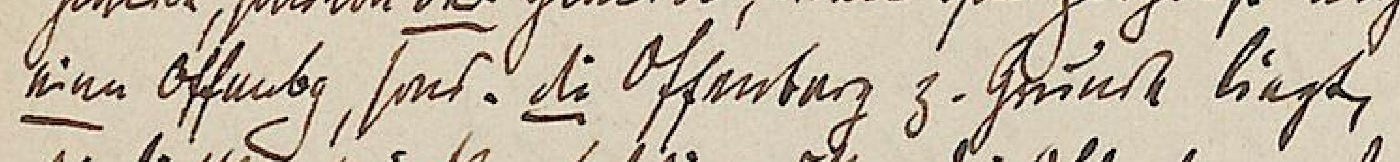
eine Offenbg, sond. die Offenbarg z. Grunde liegt,
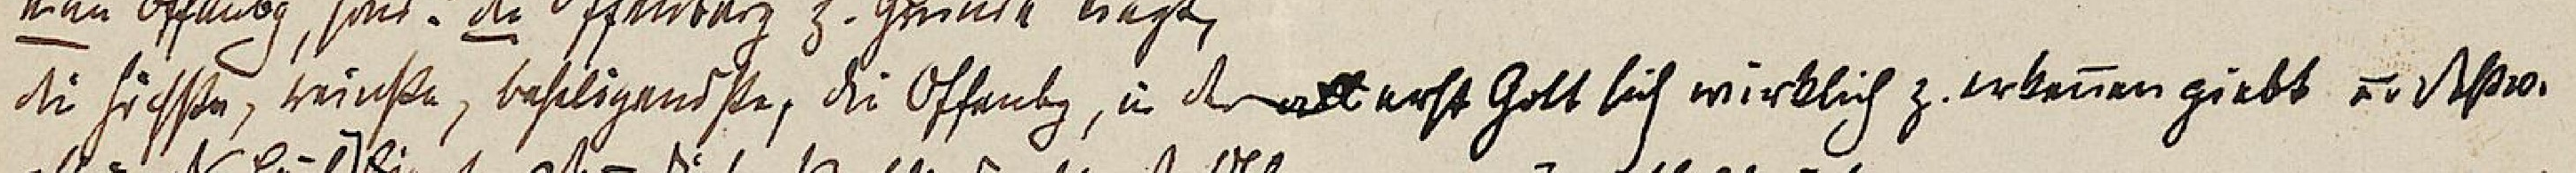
die höchste, reinste, besligendste, die Offenbg, in der all erst Gott sich wirklich z. erkenen giebt u. daß v.
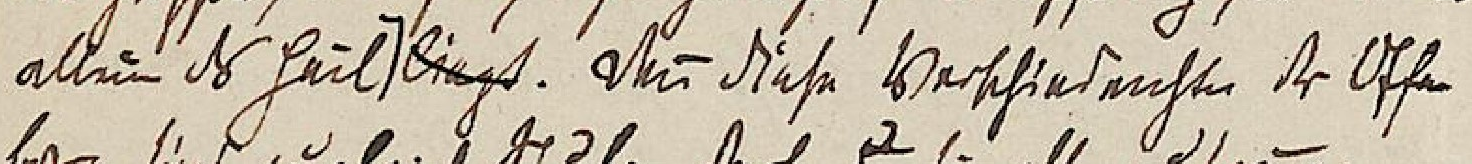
allein d.Heil ] liegt. Denn diese Verschiedenheiten der Offen¬
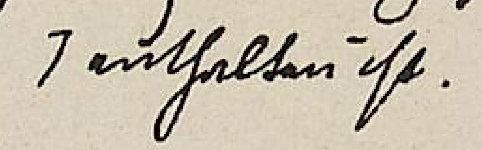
] enthalten ist.
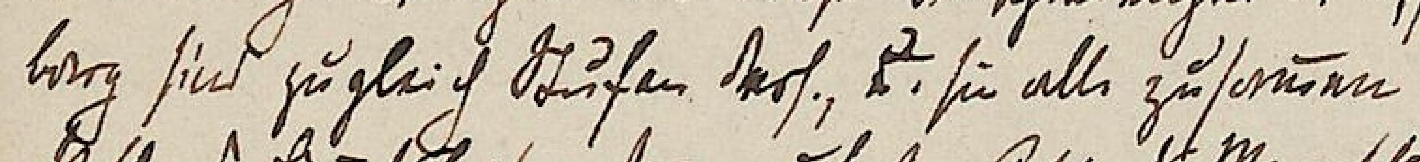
barg sind zugleich Stufen ders., u. sie alle zusamen
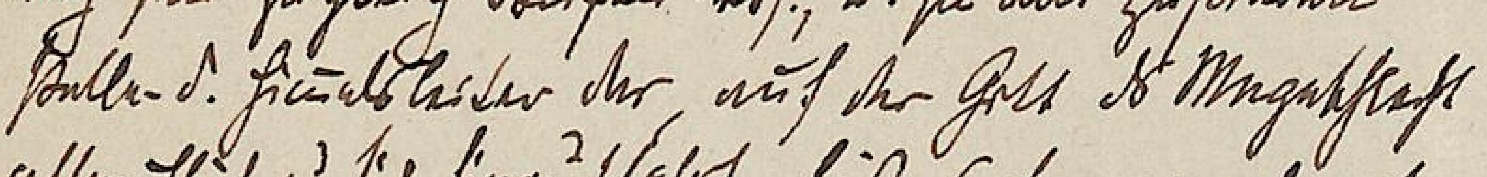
stelle. d. Himelsleiter dar, auf der Gott ds Mngeschlecht
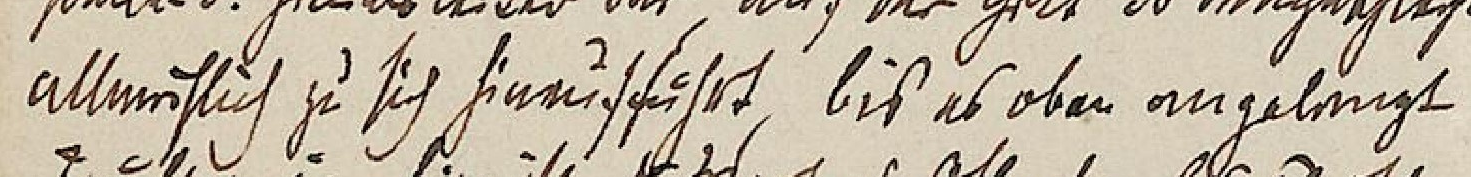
allmählich zu sich hinaufführt, bis es oben angelangt
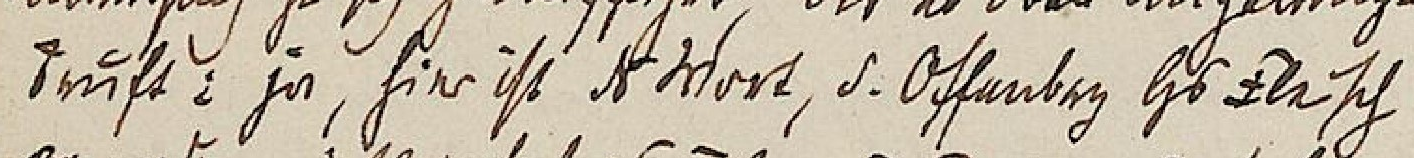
u. ruft: "ja, hier ist ds. Wort, d. Offenbrg Gs Fleisch
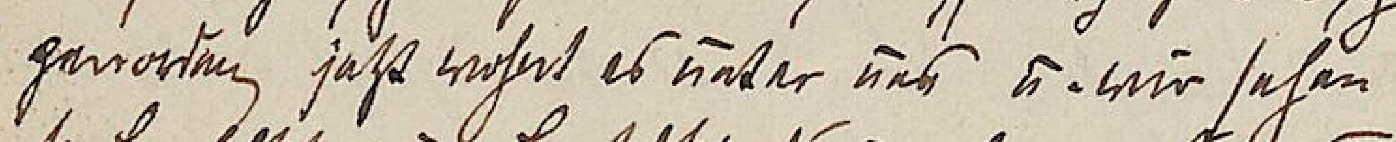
geworden, jetzt wohnt es unter uns u. wir sehen
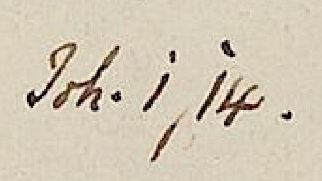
Joh. 1,14..
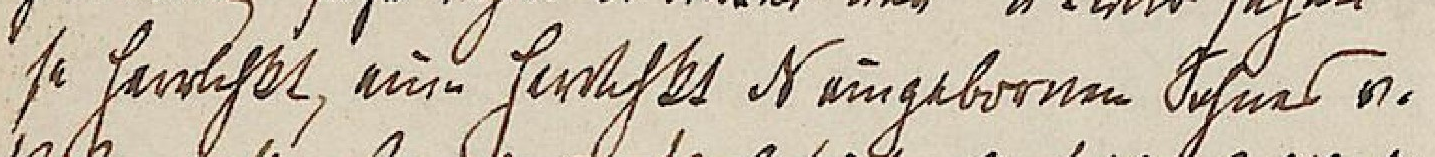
sie Herrlichkt, eine Herrlichkt ds eingebornen Sohnes v.
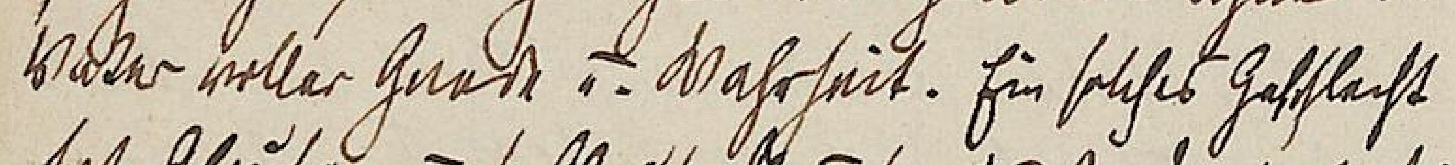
Vater voller Gnade u. Wahrheit. Ein solches Geschlecht
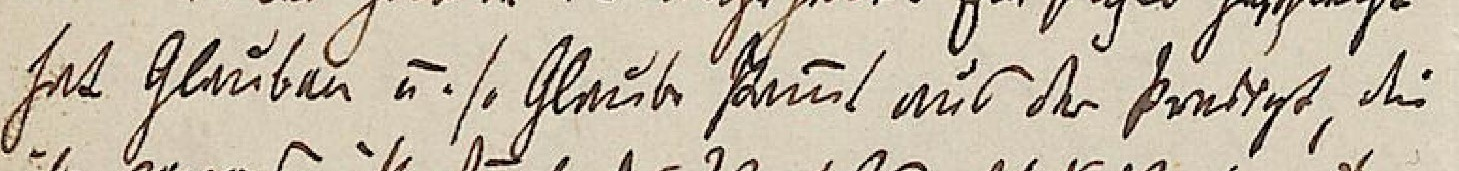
hat Glauben u. s. Glaube stamt aus der Predigt, die
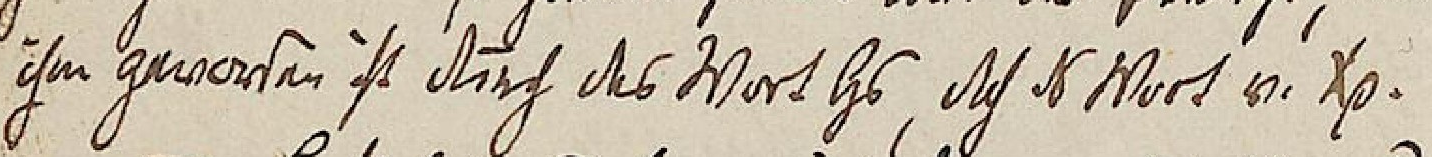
ihm geworden ist durch das Wort Gs, dch ds Wort v. Χρ.
